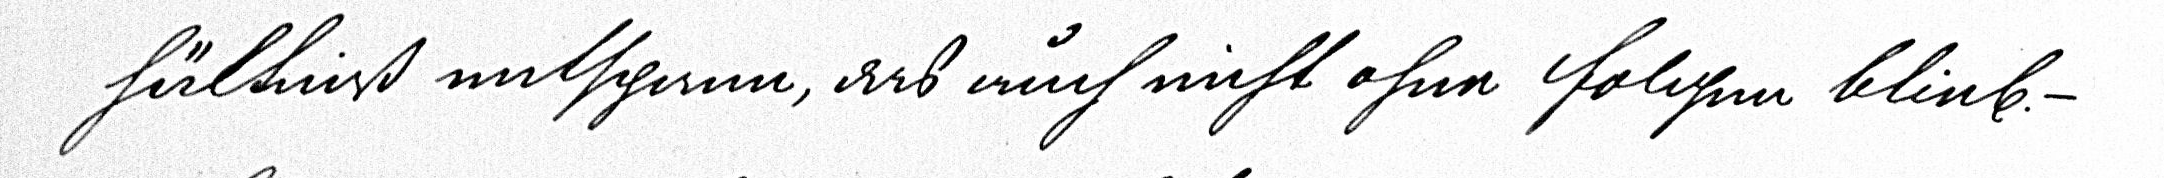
hältniß entspann, das auch nicht ohne folgen blieb.-
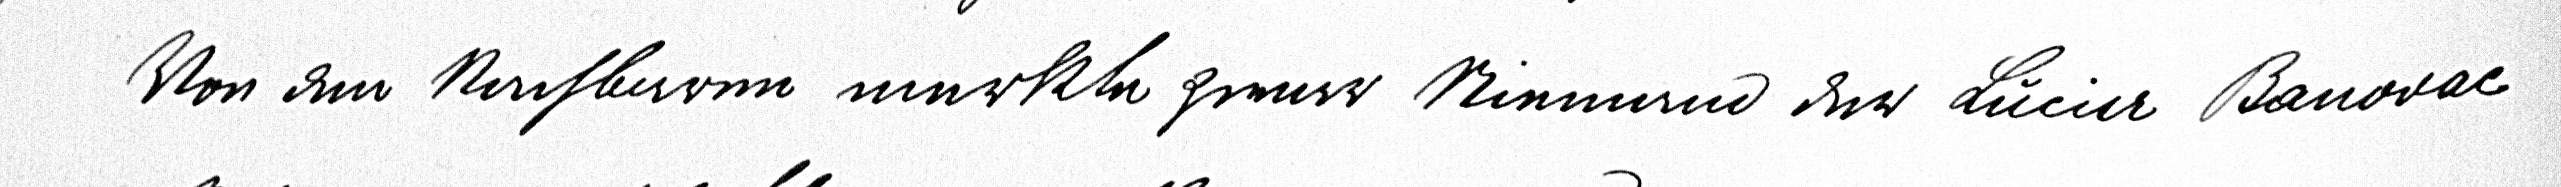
Von den Nachbaren merkte zwar Niemand der Lucia Banovac
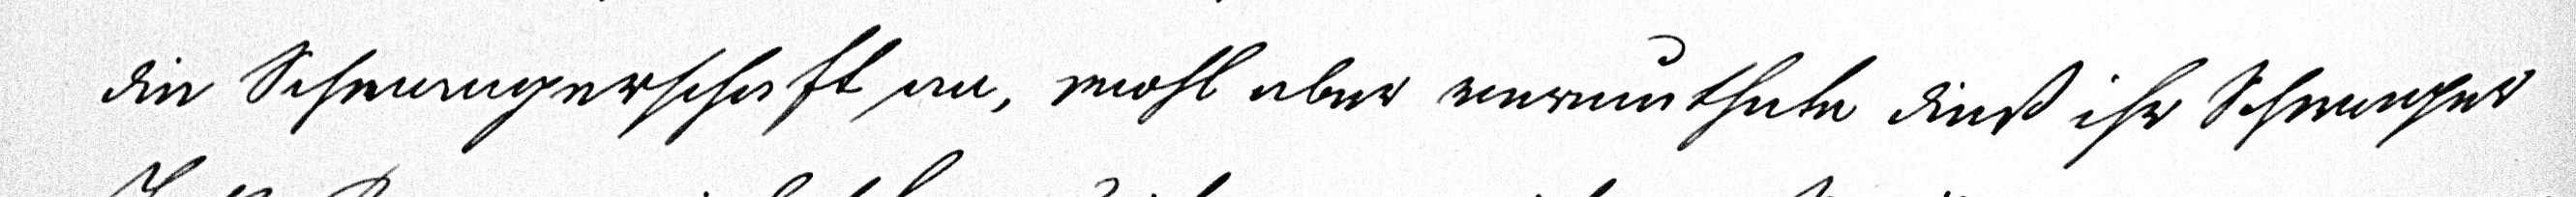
die Schxxgerschaft an, wohl aber vermuthete dieß ihr Schweger
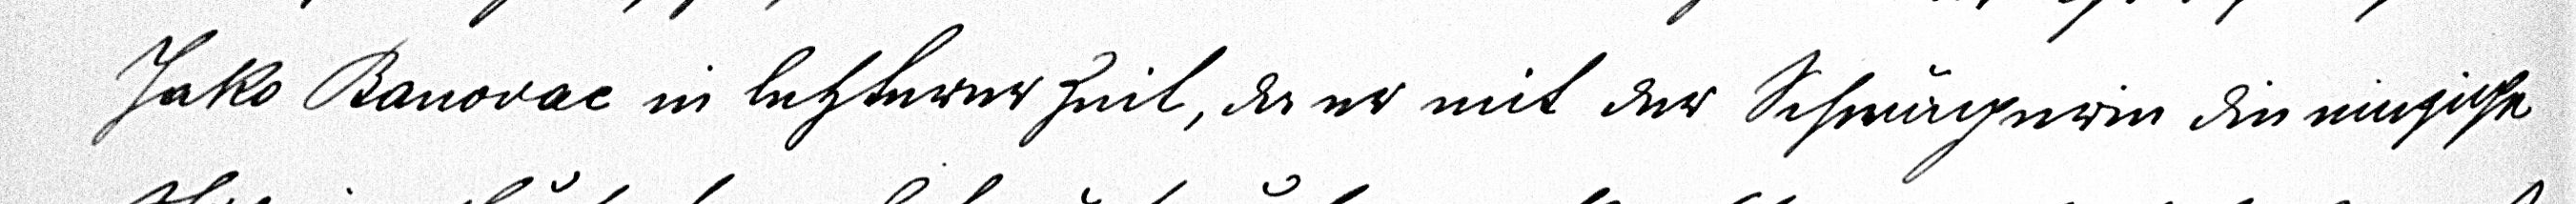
Jako Banovac in letzterer Zeit, da er mit der Schwurgerin die einzige
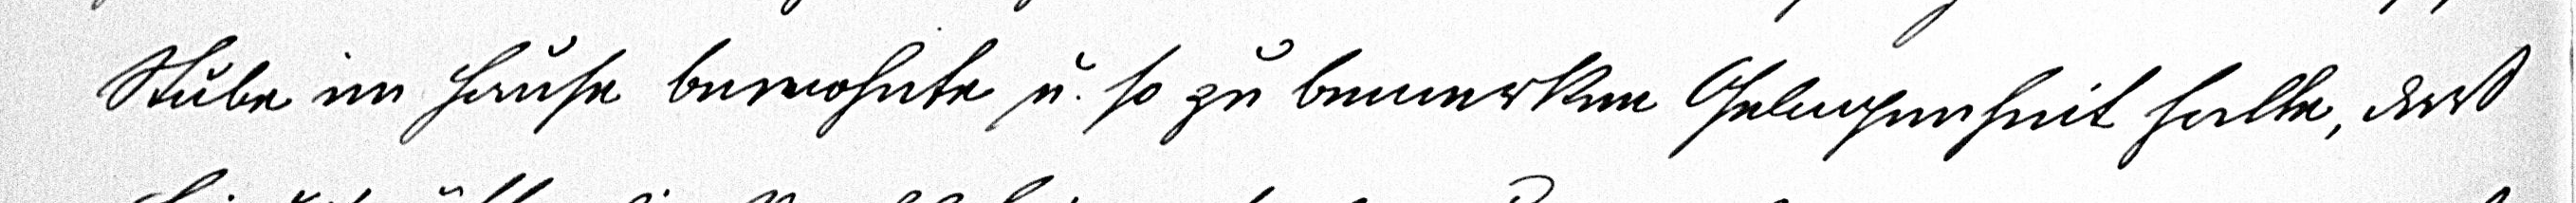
Stube im Hause bewohnte u. so zu bemerken Gelegenheit halte, daß
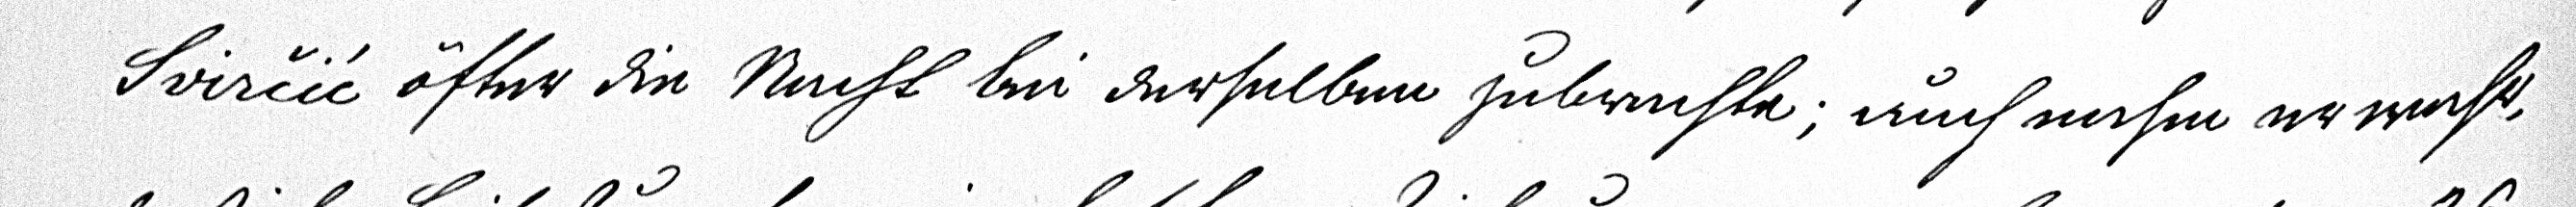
Svirčić öfter die Nacht bei derselben zubrachte; auch nahm er wehr,
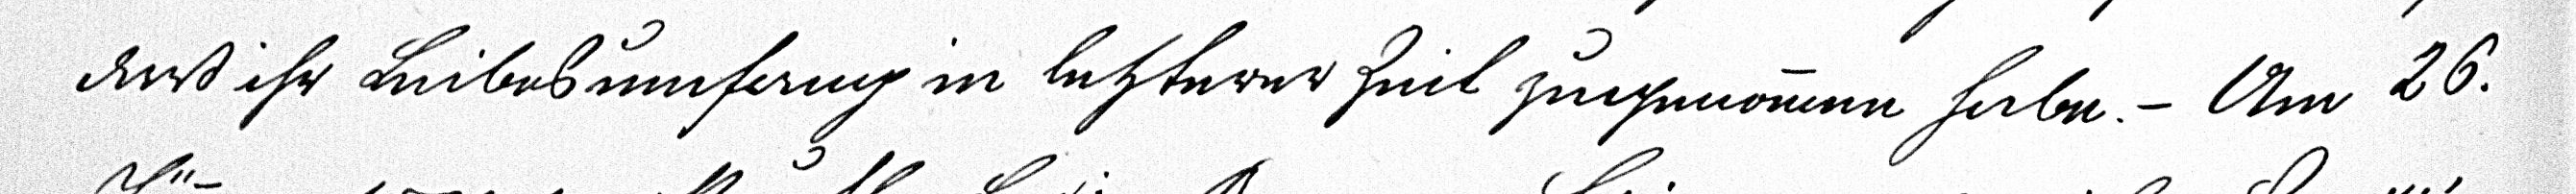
daß ihr Leibesumfang in letzterer Zeit zugenommen habe. - Am 26.
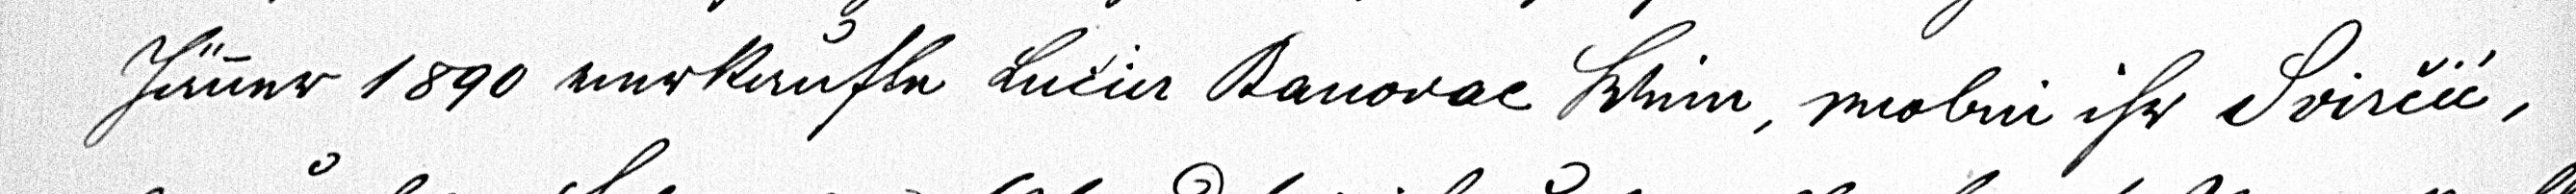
Jänner 1890 verkaufte Lucia Banovac Wein, wobei ihr Svirčić,
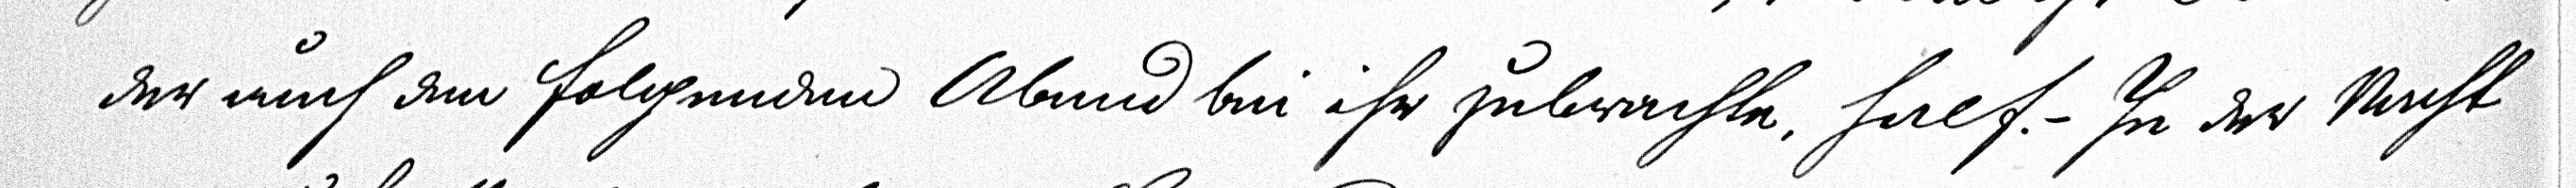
der auch den folgenden Abend bei ihr zubrachte, half.- In der Nacht
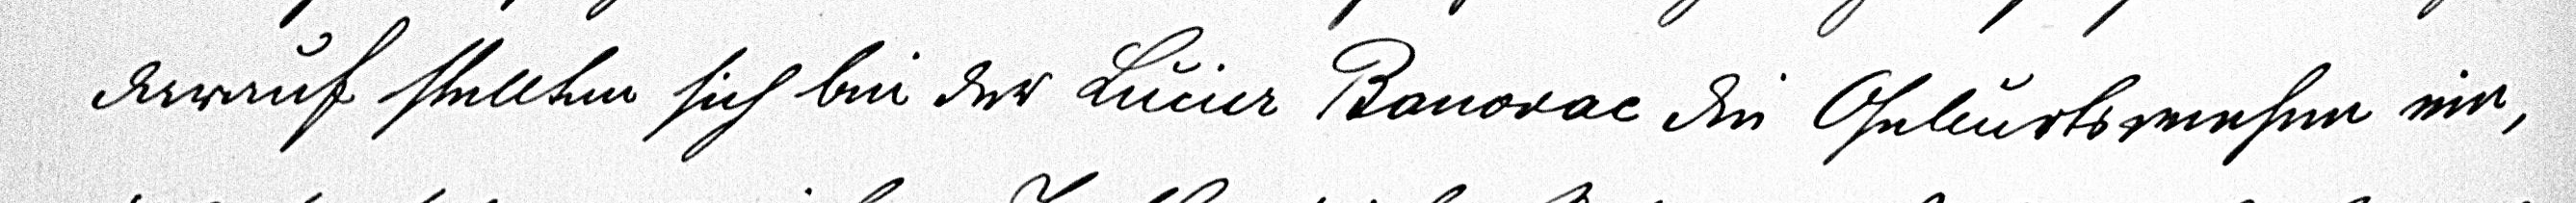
darauf stellten sich bei der Lucia Banovac die Geburtswehen ein,
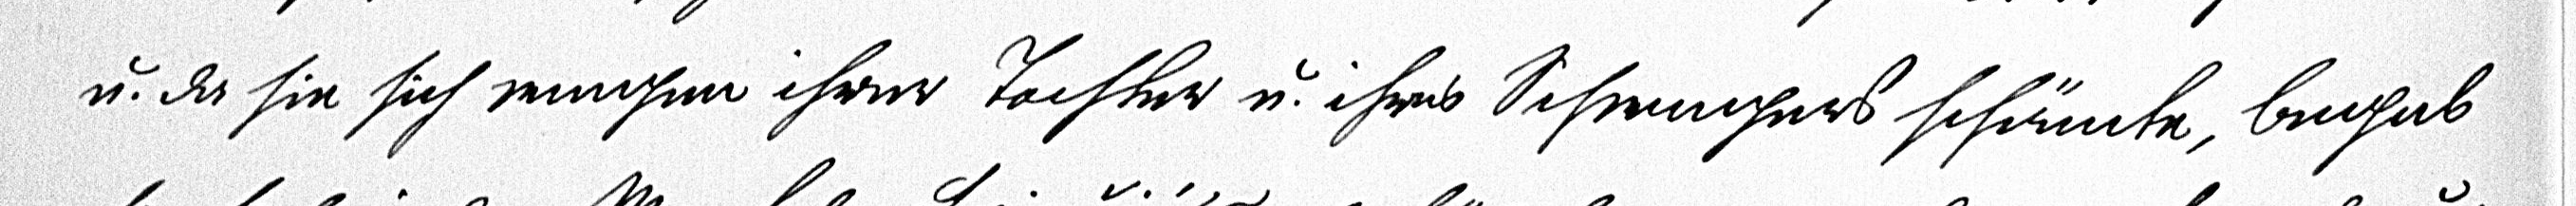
u. da sie sich wegen ihrer Tochter u. ihres Schwegers schämte, begab
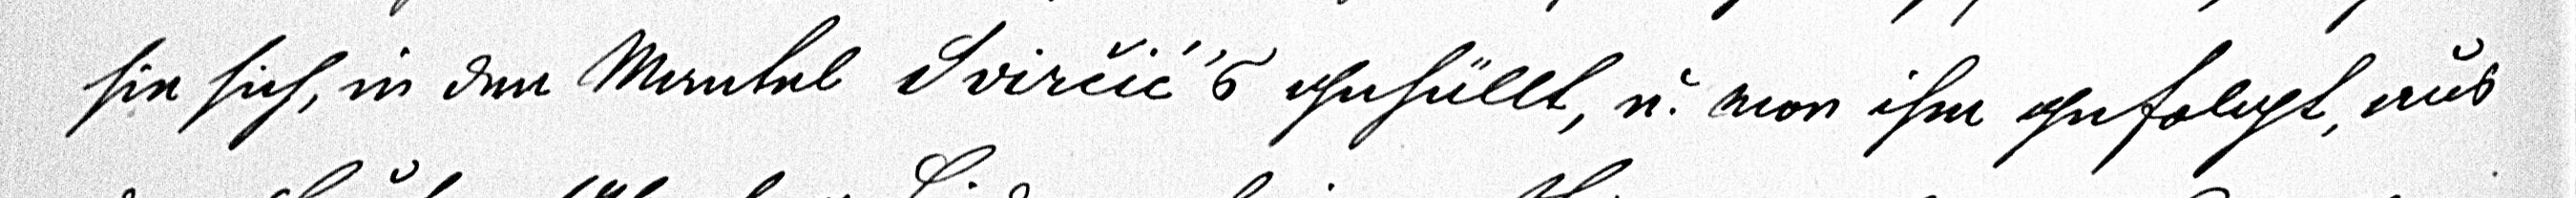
sie sich, in den Mantel Svirčić's gehüllt, u. von ihm gefolgt, aus
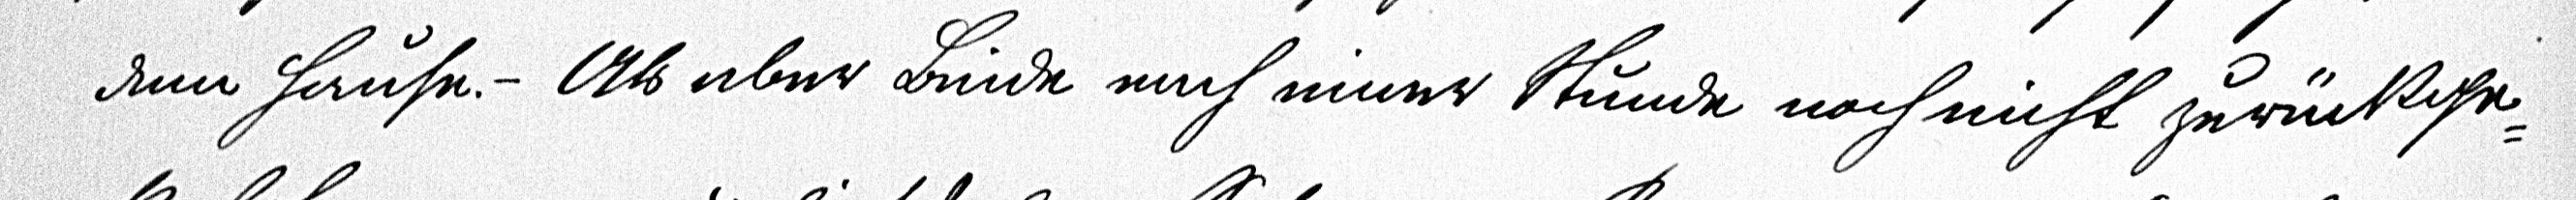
dem Hause.- Als aber Beide nach einer Stunde noch nicht zurückge¬
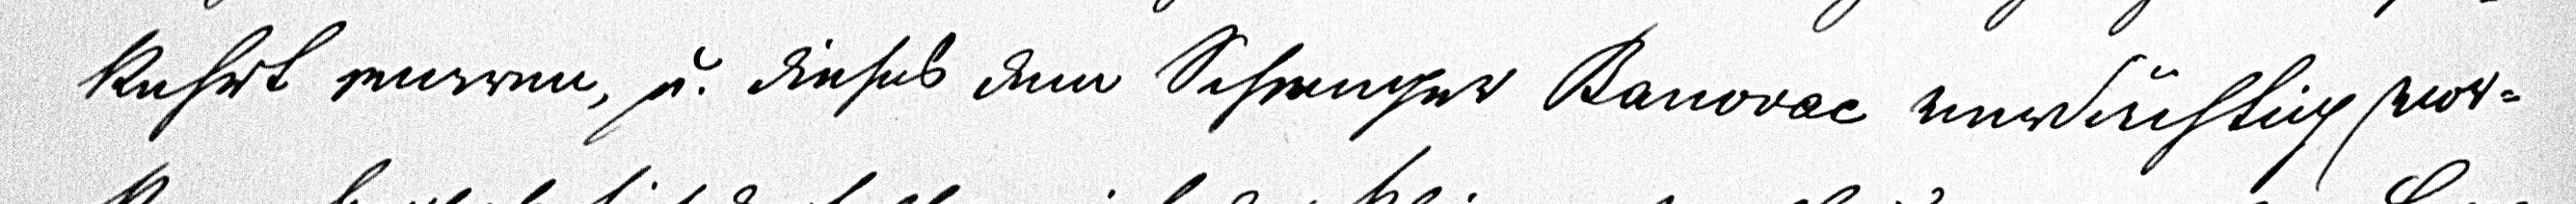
kehrt waren, u. dieses dem schweger Banovac verdächtig vor¬
